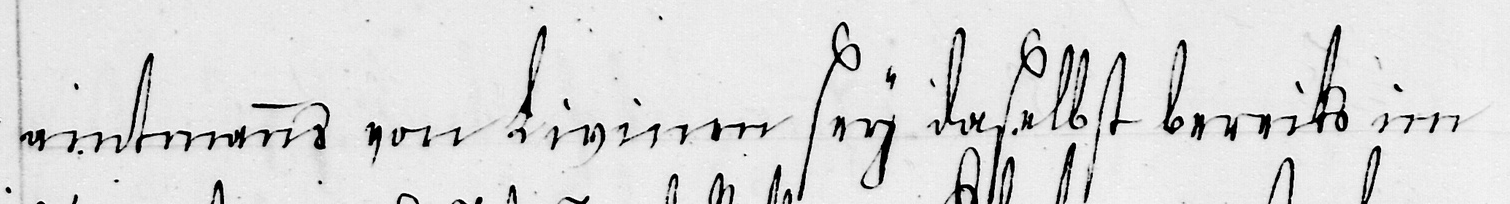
amtmanns von Livinen sey daselbst bereits im
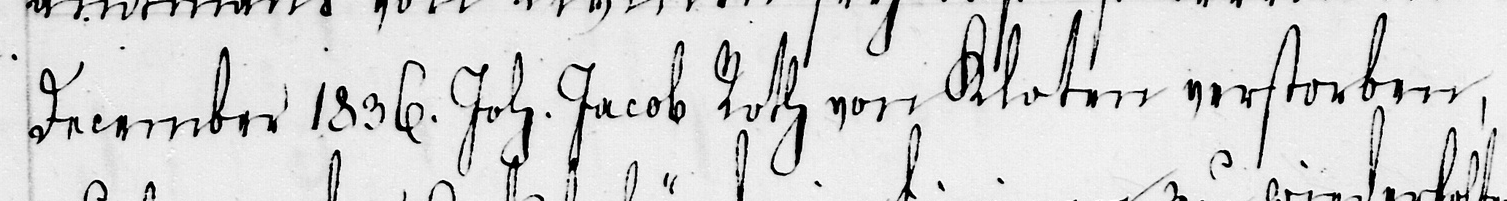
December 1836. Joh. Jacob Roth von Kloten verstorben,
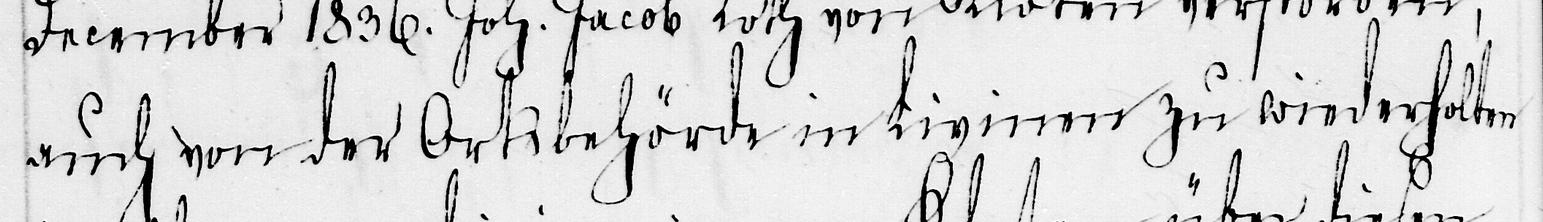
auch von der Ortsbehörde in Livinen zu wiederholten
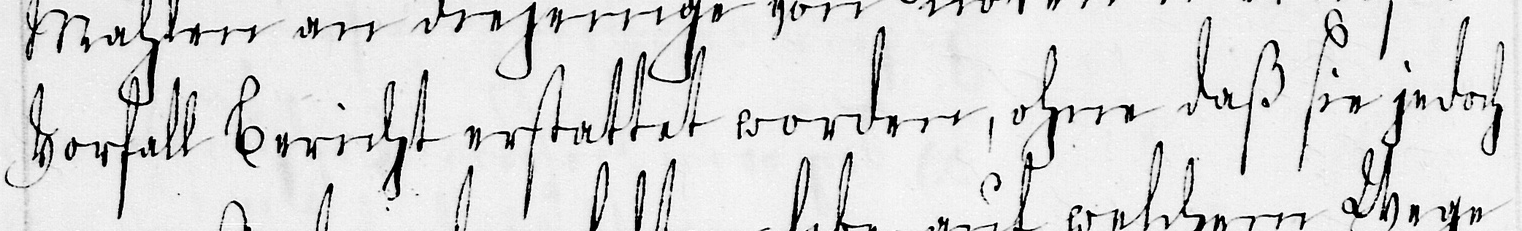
Vorfall Bericht erstattet worden, ohne daß sie jedoch
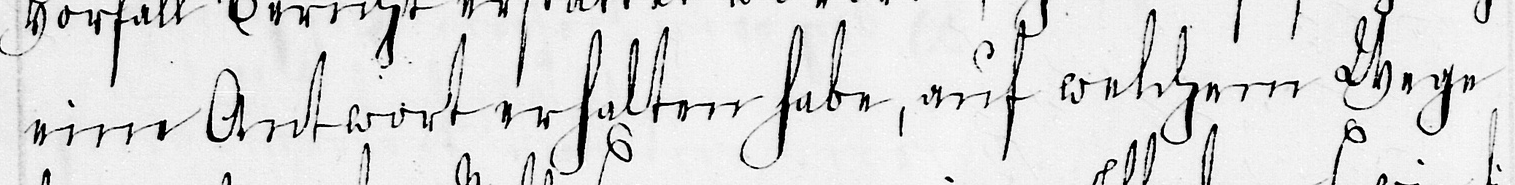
eine Antwort erhalten habe, auf welchem Wege
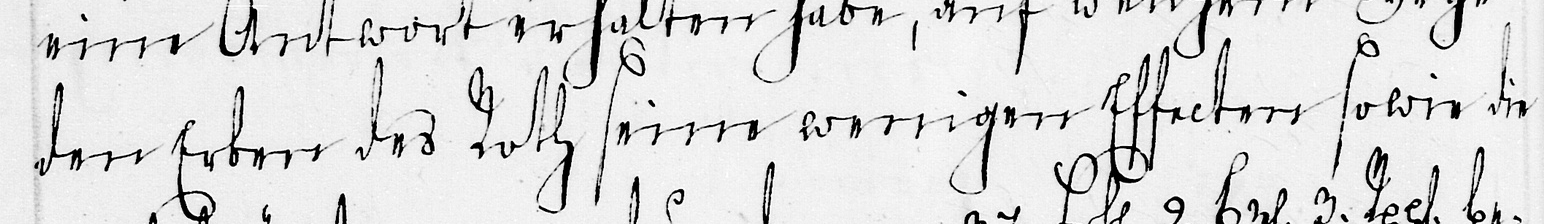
den Erben des Roth seine wenigen Effecten sowie die
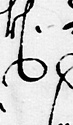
be¬
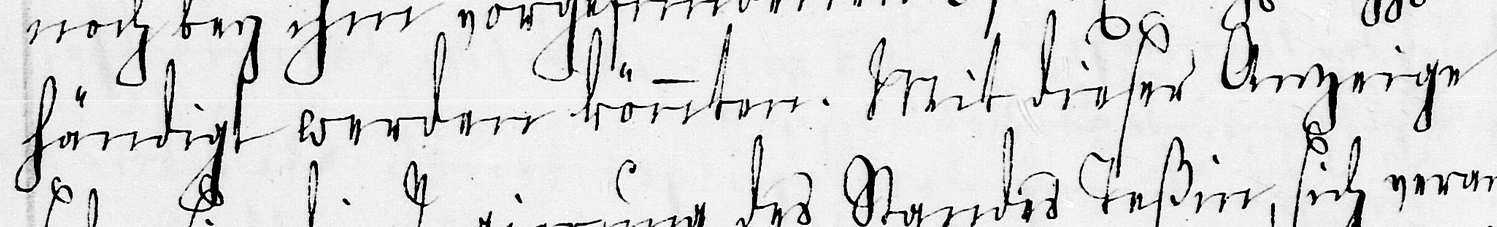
händigt werden könnten. Mit dieser Anzeige
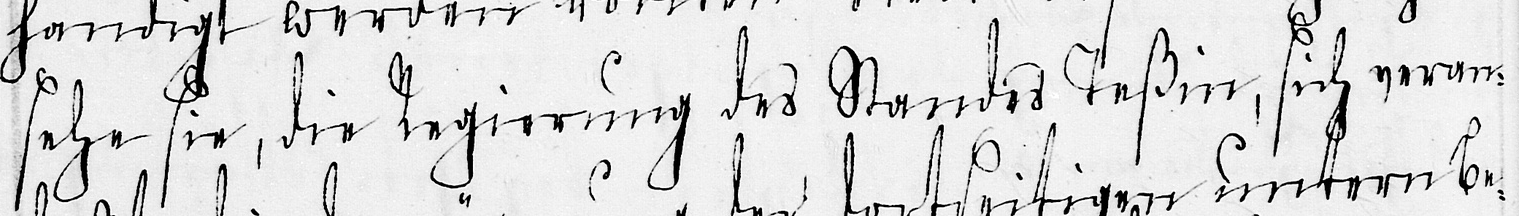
sehe sie, die Regierung des Standes Teßin, sich veran¬
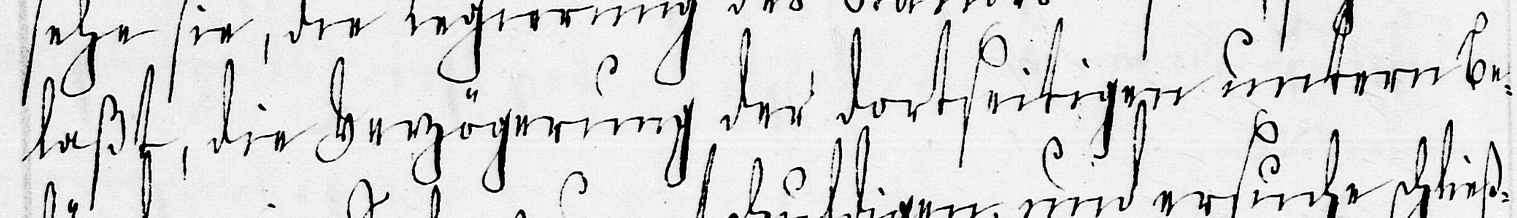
laßt, die Verzögerung der dortseitigen untern Be¬
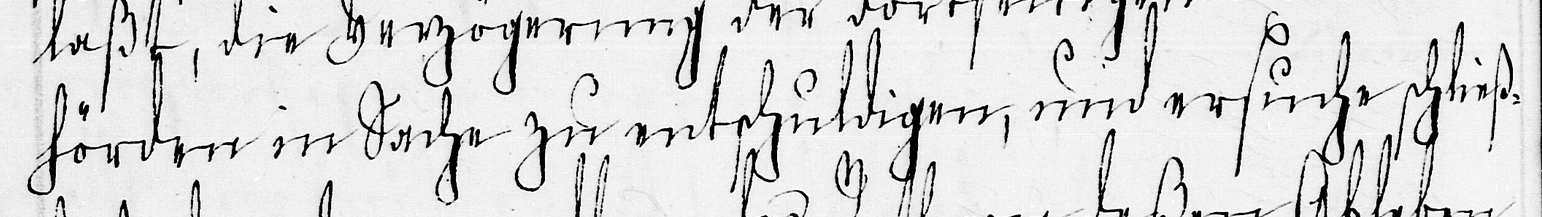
hörden in Sache zu entschuldigen, und versuche schließ¬
